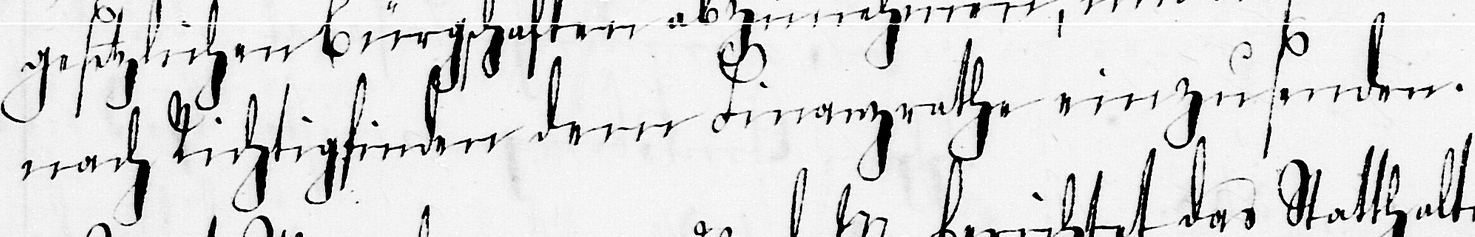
nach Richtigfinden dem Finanzrathe einzusenden.
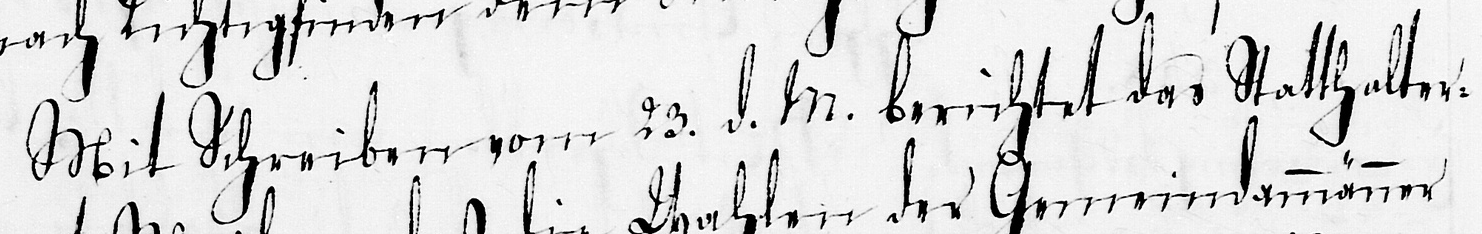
Mit Schreiben vom 23. d. M. berichtet das Statthalte¬
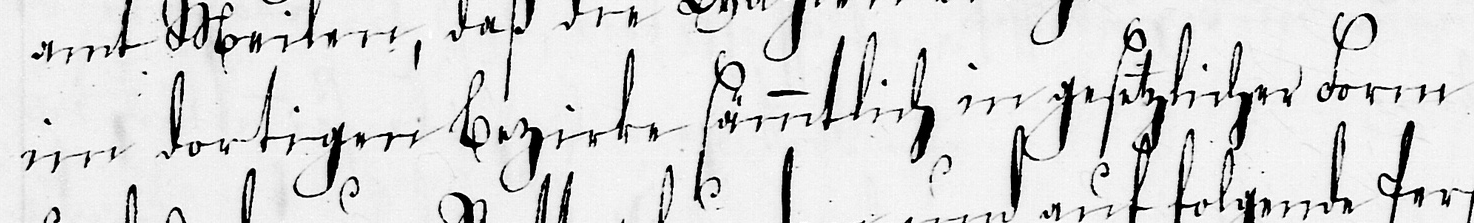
im dortigen Bezirke sämmtlich in gesetzlicher Form
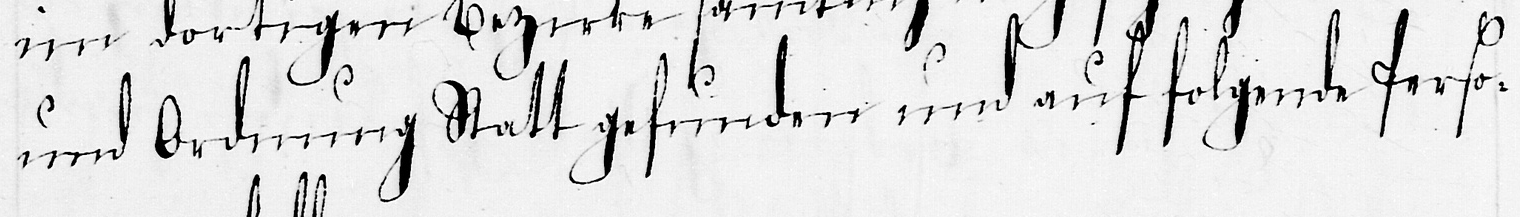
und Ordnung Statt gefunden und auf folgende Perso¬
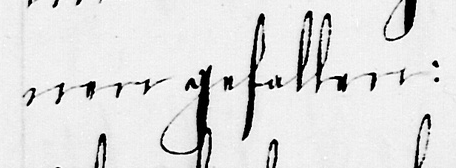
nen gefallen:
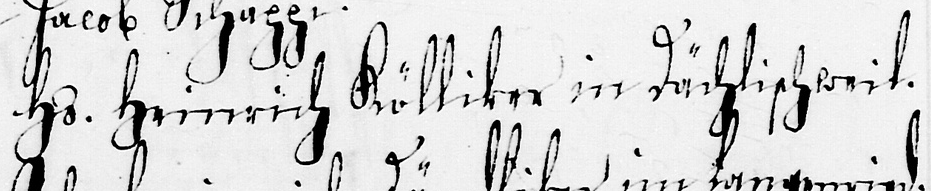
Hs. Heinrich Kölliker in Dächlischweil.
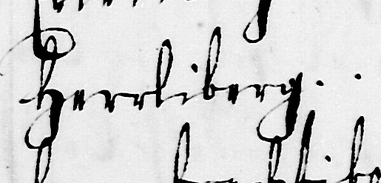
Herrliberg
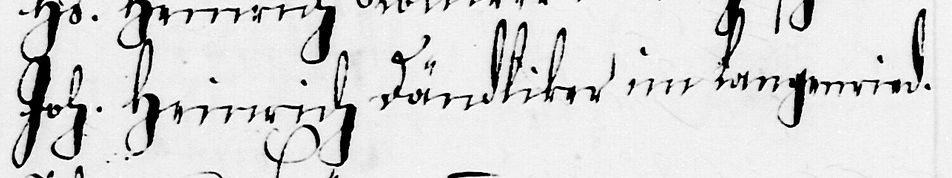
Joh. Heinrich Dändliker im Langenried.
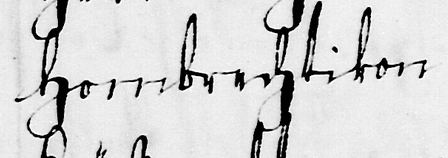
Hombrechtikon
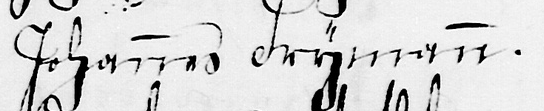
Johannes Frymann.
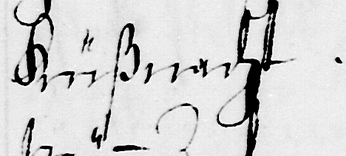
Küßnacht
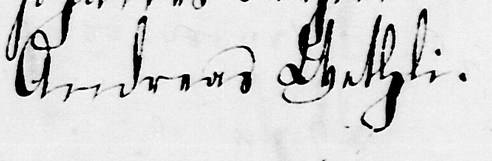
Andreas Wethli.
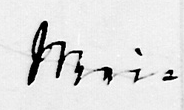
Wei¬
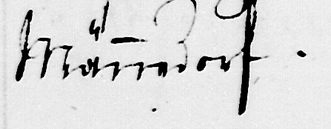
Männedorf
